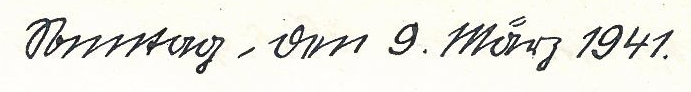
Sonntag, den 9. März 1941.
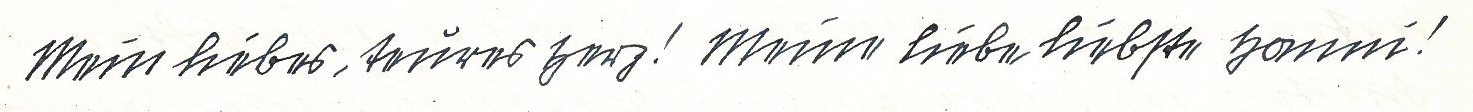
Mein liebes, teures Herz! Meine liebe, liebste !
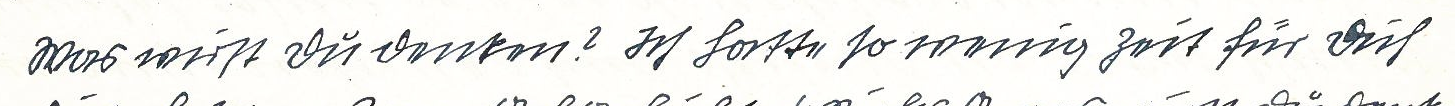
Was wirst Du denken? Ich hatte so wenig Zeit für Dich
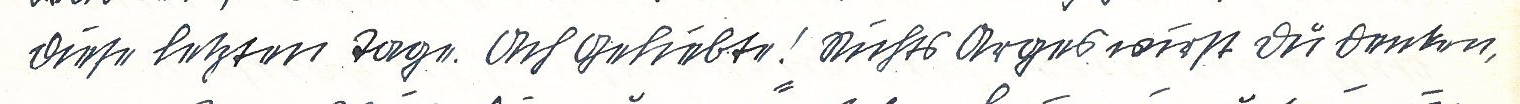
diese letzten Tage. Ach Geliebte! Nichts Arges wirst Du denken,
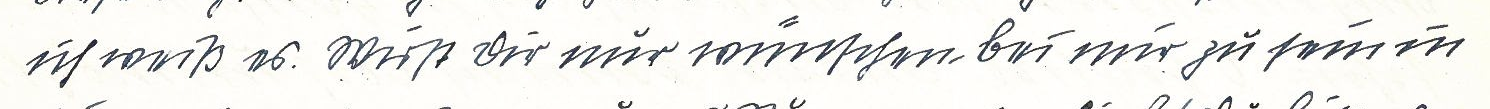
ich weiß es. Wirst Dir nur wünschen, bei mir zu sein in
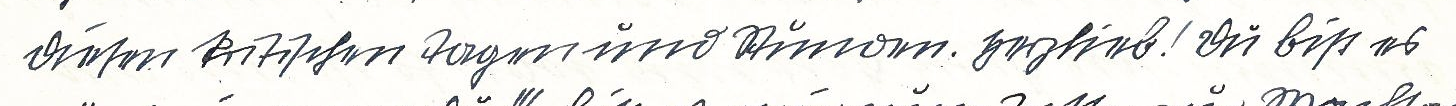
diesen kritischen Tagen und Stunden. Herzlieb! Du bist es
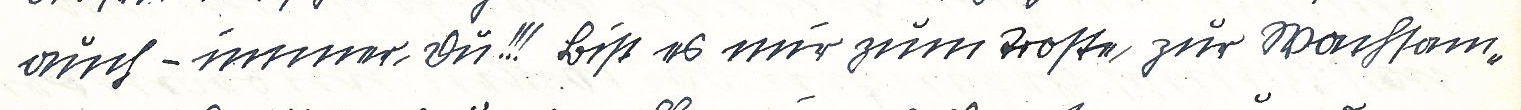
auch – immer Du!!! Bist es mir zum Troste, zur Wachsam¬
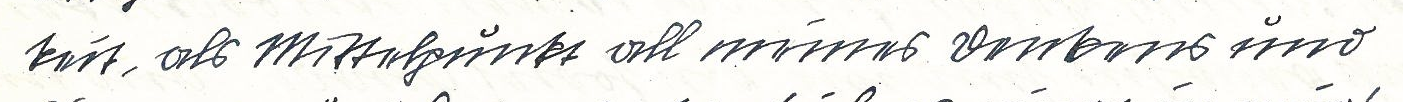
keit, als Mittelpunkt all meines Denkens und
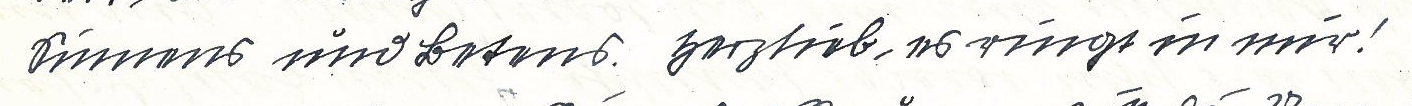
Sinnens und Betens. Herzlieb, es ringt in mir!
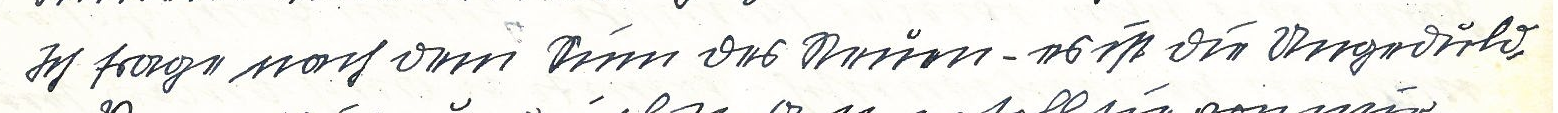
Ich frage nach dem Sinn des Neuen – es ist die Ungeduld,
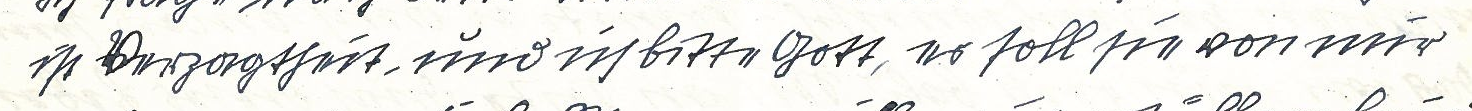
ist Verzagtheit, und ich bitte Gott, er soll sie von mir
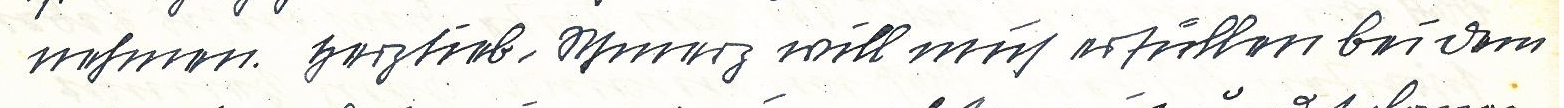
nehmen. Herzlieb, Schmerz will mich erfüllen bei dem
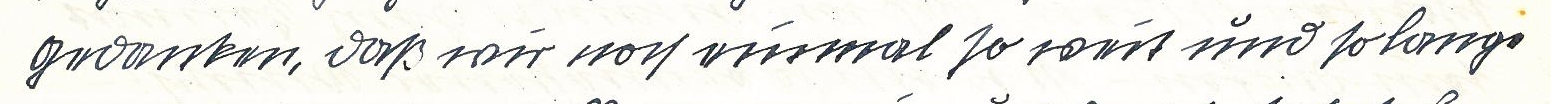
Gedanken, daß wir noch einmal so weit und so lange
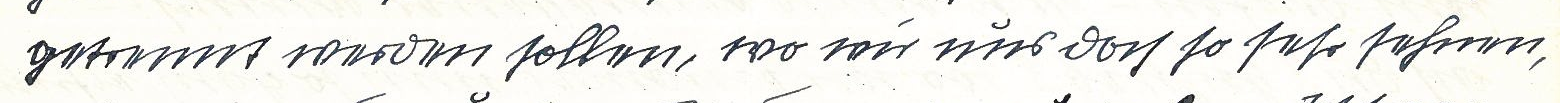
getrennt werden sollen, wo wir uns doch so sehr sehnen,
